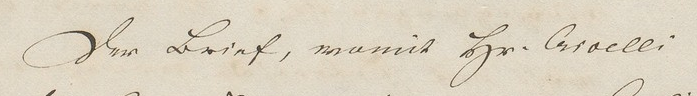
Der Brief, womit Hr. Crivelli
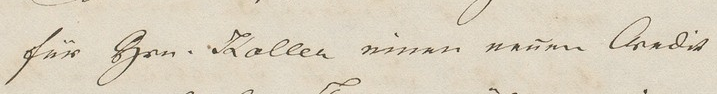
für Hrn. Koller einen neuen Credit
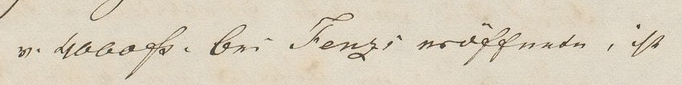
v. 4000 Fs. bei Fenzi eröffnete, ist
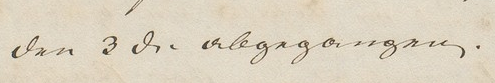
den 3 d. abgegangen.
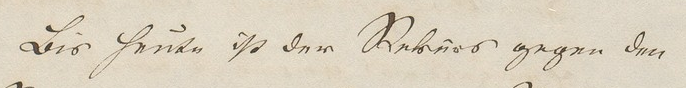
Bis heute ist der Rekurs gegen den
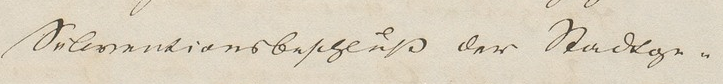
Subventionsbeschluß der Stadtge-
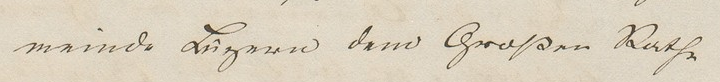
meinde Luzern dem Großen Rathe
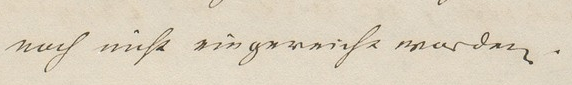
noch nicht eingereicht worden.
